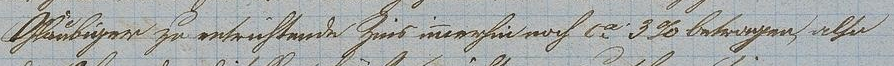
Gläubiger zu entrichtende Zins immerhin noch ca 3% betragen, also
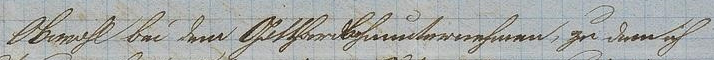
Obwohl bei dem Gotthardbahnunternehmen, zu dem ich
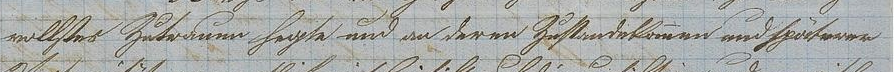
vollstes Zutrauen hegte und an deren Zustandekommen und späterer
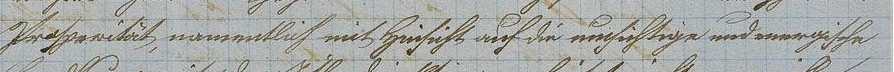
Prosperität, namentlich mit Hinsicht auf die umsichtige und energische
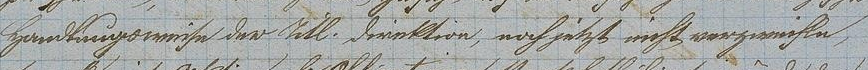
Handlungsweise der Titl. Direktion, noch jetzt nicht verzweifle,
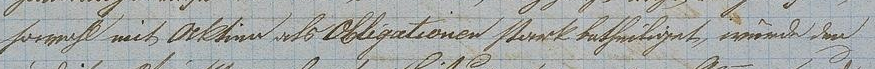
sowohl mit Aktien als Obligationen stark betheiliget, würde den
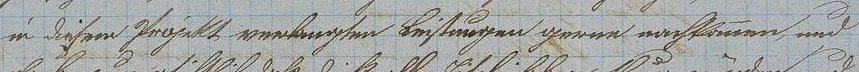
in diesem Projekt verlangten Leistungen gerne nachkommen, und
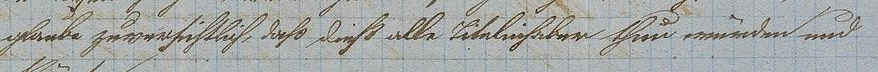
glaube zuversichtlich, daß dieß alle Titelinhaber thun würden und
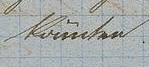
könnten.
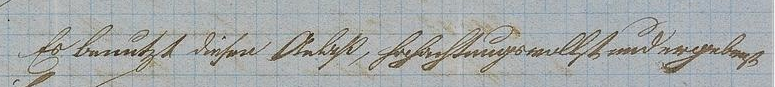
Es benutzt diesen Anlaß, hochachtungsvollst und ergebenst
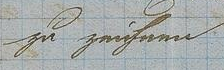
zu zeichnen
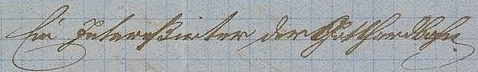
Ein Intereßirter der Gotthardbahn.
